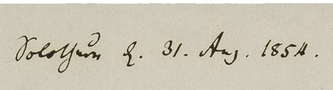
Solothurn d. 31. Aug. 1854.
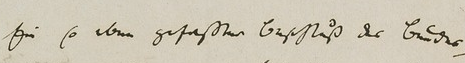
Ein so eben gefaßter Beschluß des Bundes-
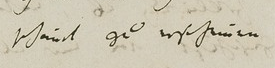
schämt zu erscheinen.
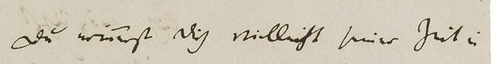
Du erinnerst Dich vielleicht seiner Zeit in
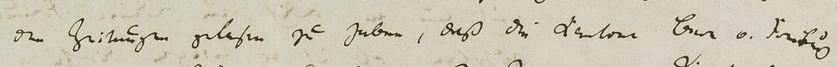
den Zeitungen gelesen zu haben, daß die Kantone Bern &. Freiburg
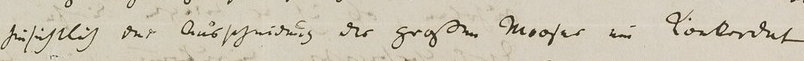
hinsichtlich der Ausscheidung des großen Mooses ein Konkordat
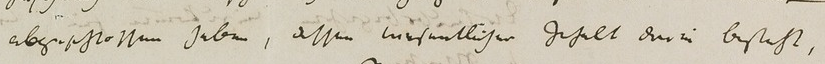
abgeschlossen haben, dessen wesentlicher Inhalt darin besteht,
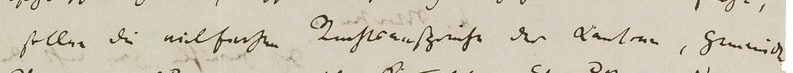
sollen die vielfachen Rechtsansprüche der Kantone, Gemeinden
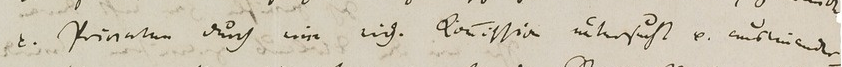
&. Privaten durch eine eidg. Kommission untersucht &. auseinander-
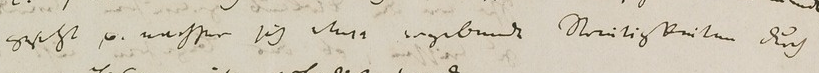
gesetzt &. nachher sich etwa ergebende Streitigkeiten durch
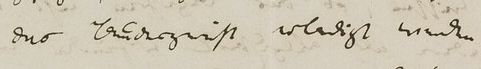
das Bundesgericht erledigt werden.
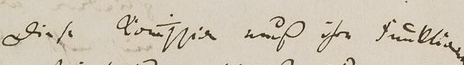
Diese Kommission muß ihre Funktionen
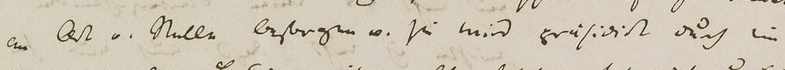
an Ort &. Stelle besorgen &. sie wird präsidirt durch ein
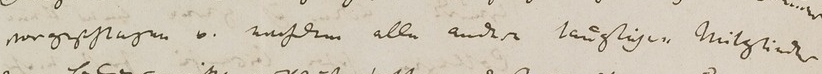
vorgeschlagen &. nachdem alle andern tauglichen Mitglieder
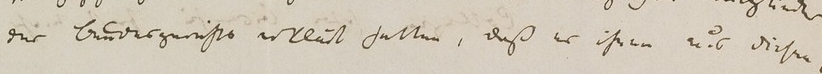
des Bundesgerichts erklärt hatten, daß es ihnen aus diesen &.
